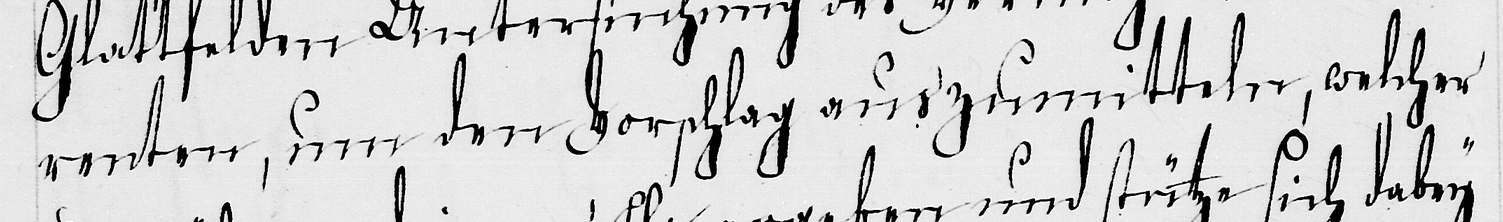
renten, um den Vorschlag auszumitteln, welcher
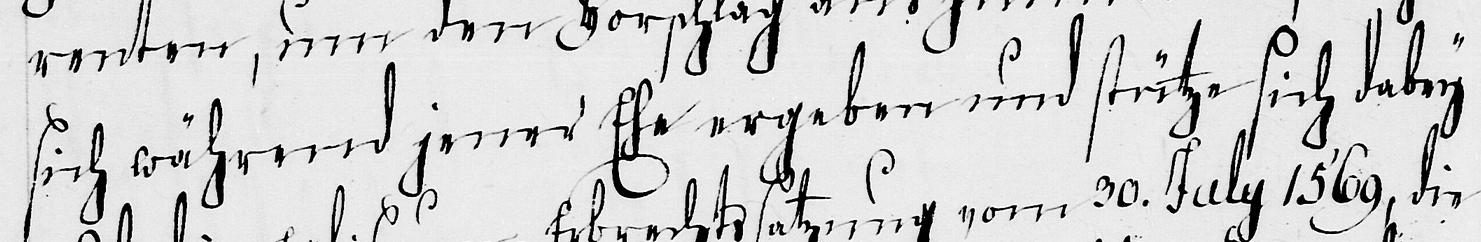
sich während jener Ehe ergeben und stütze sich dabey
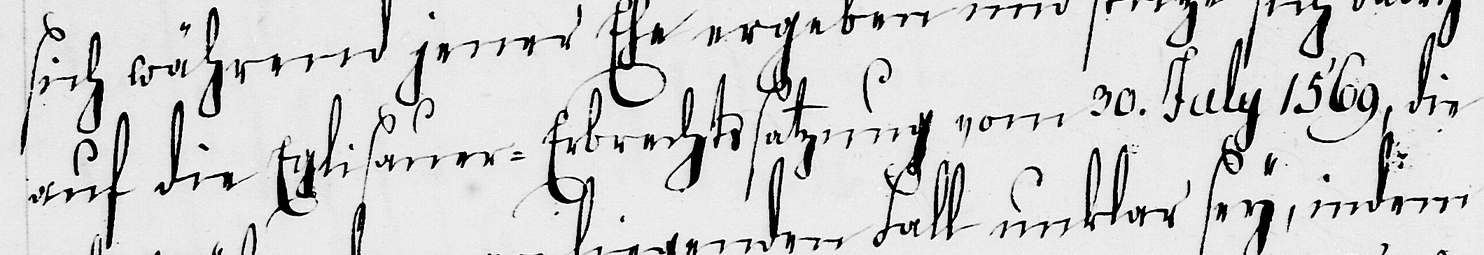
auf die Eglisauer-Erbrechtssatzung vom 30. July 1569, die
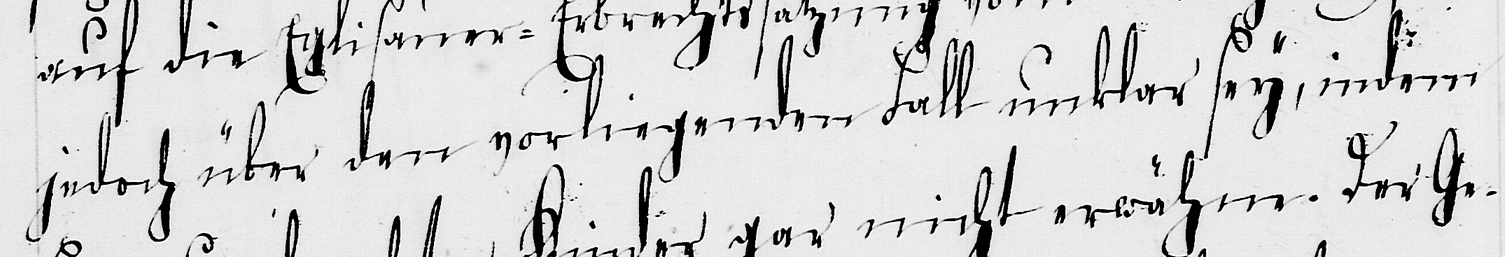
jedoch über den vorliegenden Fall unklar sey, indem
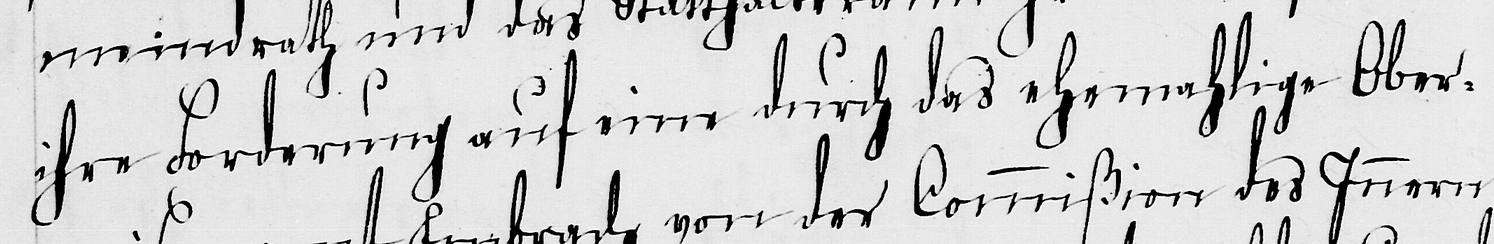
ihre Forderung auf eine durch das ehemahlige Ober¬
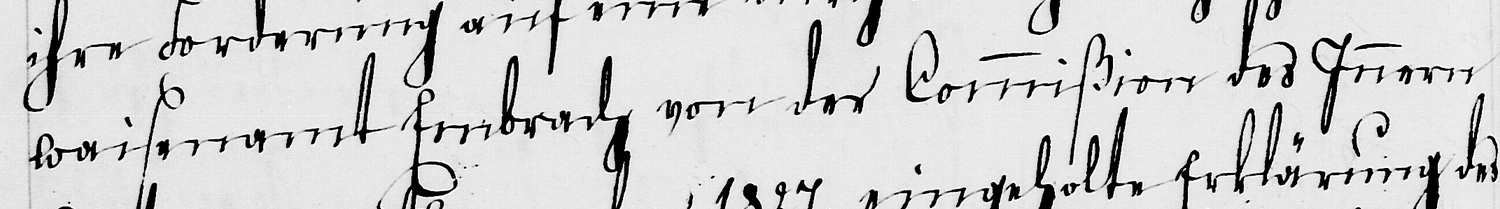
waisenamt Embrach von der Commißion des Innern
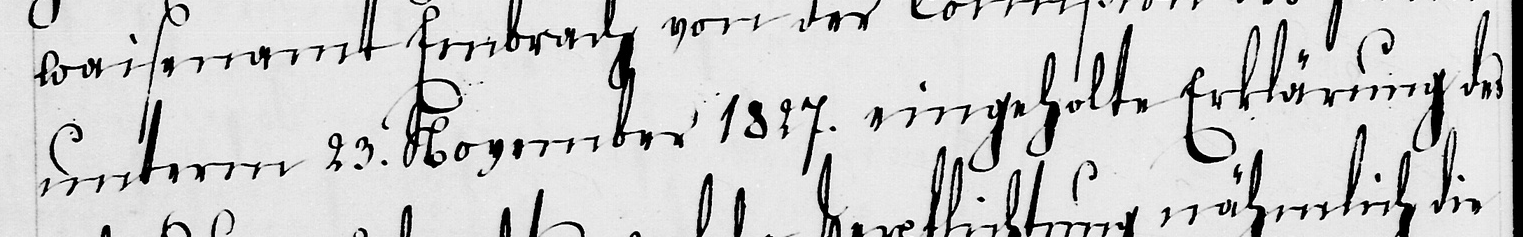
unterm 23. November 1827. eingeholte Erklärung des
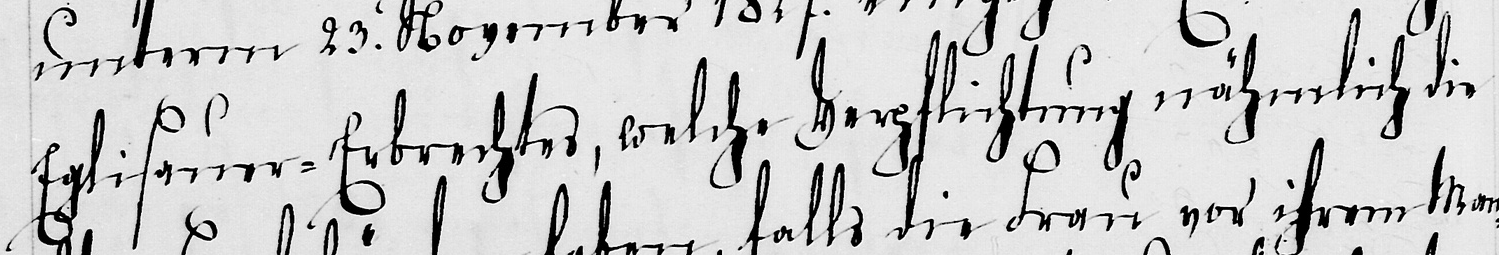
Eglisauer-Erbrechtes, welche Verpflichtung nähmlich die
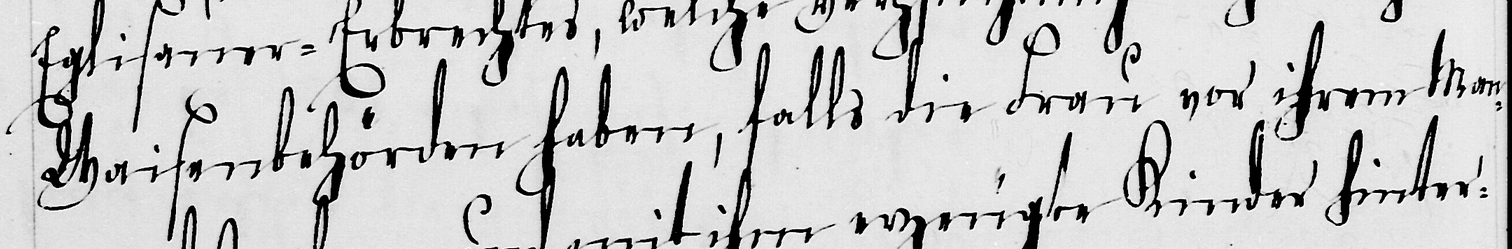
Waisenbehörden haben, falls die Frau vor ihrem Man¬
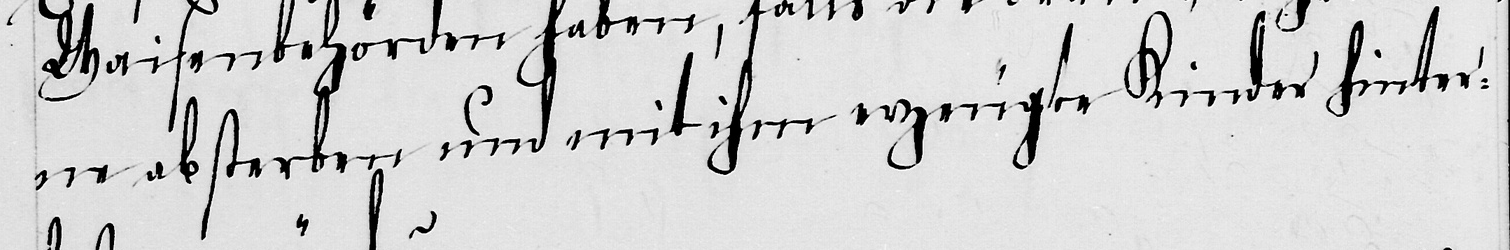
ne absterben und mit ihm erzeugte Kinder hinter¬
